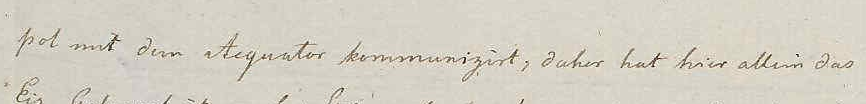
pol mit dem Aequator kommunizirt, daher hat hier allein das
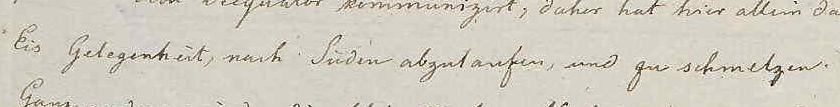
Eis Gelegenheit, nach Süden abzulaufen, und zu schmelzen.
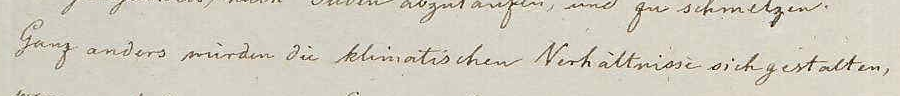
Ganz anders würden die klimatischen Verhältnisse sich gestalten,
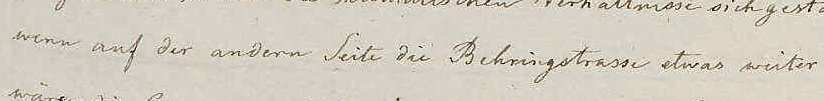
wenn auf der andern Seite die Behringstrasse etwas weiter
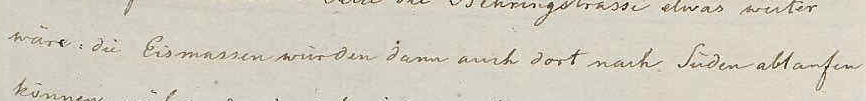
wäre: die Eismassen würden dann auch dort nach Süden ablaufen
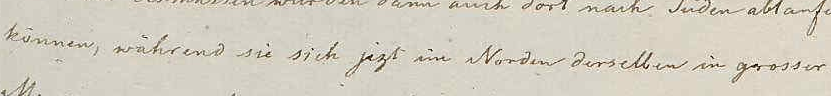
können, während sie sich jezt im Norden derselben in grosser
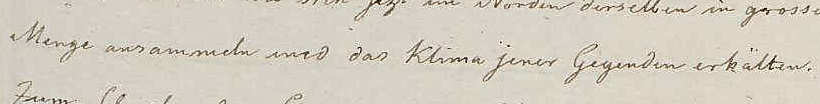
Menge ansammeln und das Klima jener Gegenden erkälten.
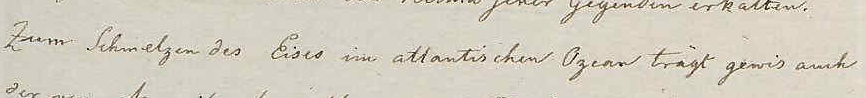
Zum Schmelzen des Eises im atlantischen Ozean trägt gewis auch
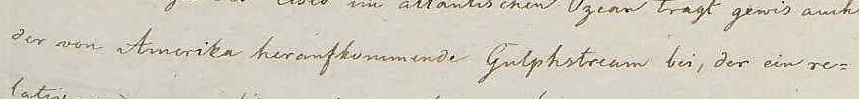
der von Amerika heraufkommende Gulphstream bei, der ein re-
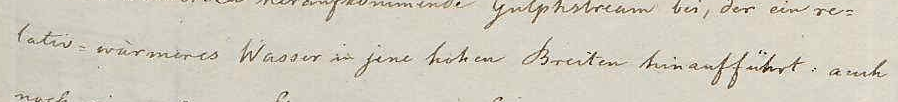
lativ-wärmeres Wasser in jene hohen Breiten hinaufführt: auch
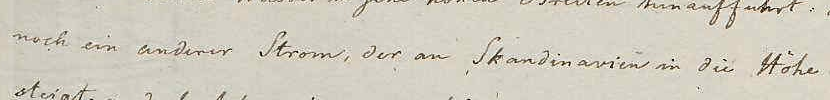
noch ein anderer Strom, der an Skandinavien in die Höhe
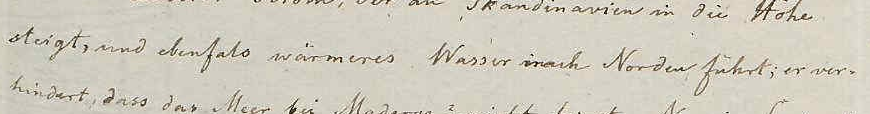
steigt, und ebenfals wärmeres Wasser innach Norden führt; er ver-
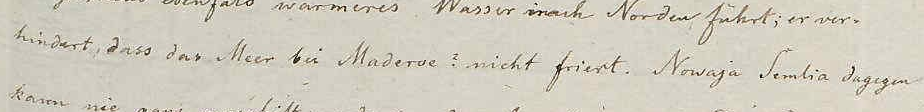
hindert, dass das Meer bei Maderoe ? nicht friert. Nowaja Semlia dagegen
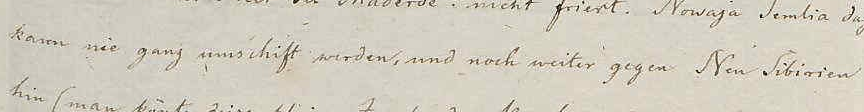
kann nie ganz umschift werden, und noch weiter gegen Neu Sibirien
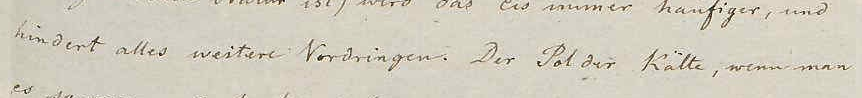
hindert alles weitere Vordringen. Der Pol der Kälte, wenn man
